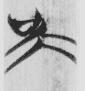吳
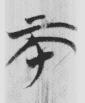帀
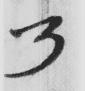乃
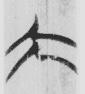大
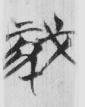{亥戈}
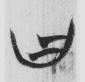曰
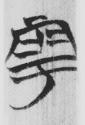𩁹
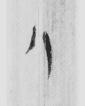人
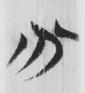分
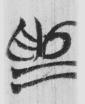爲
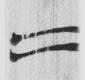二
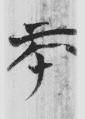帀
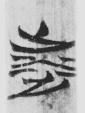涉
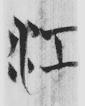江
